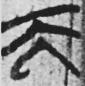而
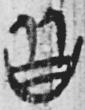皆
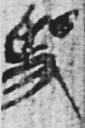臤（賢）
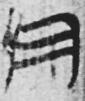於
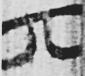亓（其）
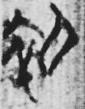初
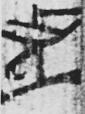者
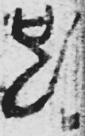也
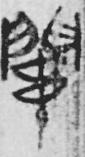○（關）
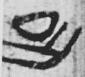疋（雎）
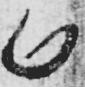㠯（以）
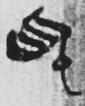色
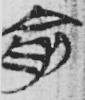俞（喻）
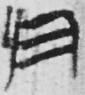於
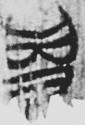豊（禮）
